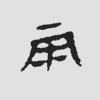雨
